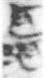聶（攝）
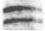二
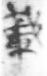載
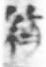紫
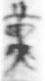黃
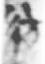紡
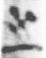之
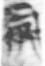綳
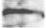一
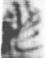○（戟）
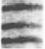三
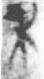果（戈）
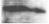一
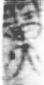翼
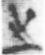之
